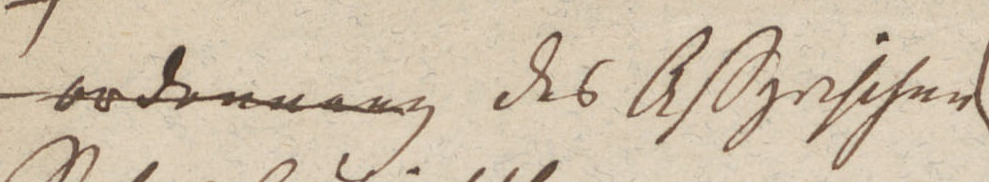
% ordonnanz des Assyrischen
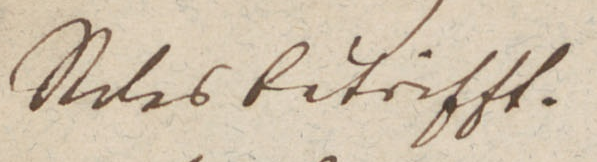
Stiles betrifft.
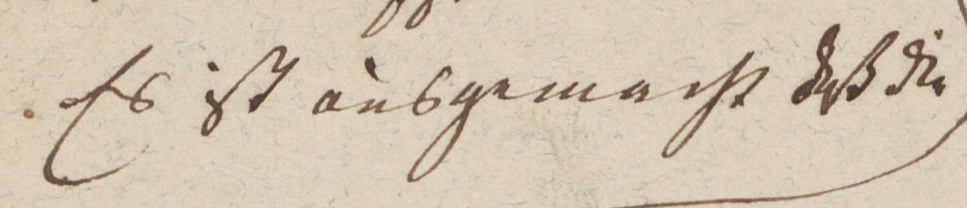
Es ist ausgemacht dass
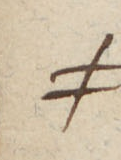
die
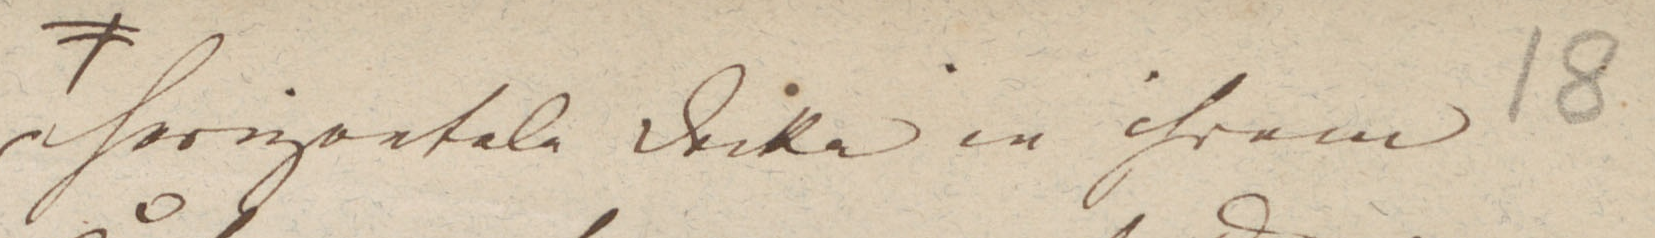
horizontale Decke in ihrem
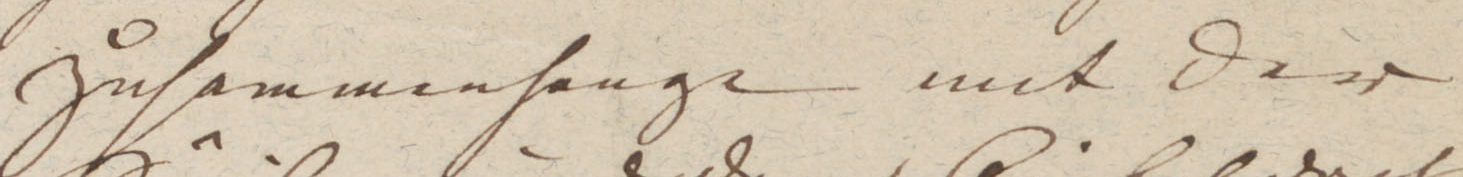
Zusammenhange mit der
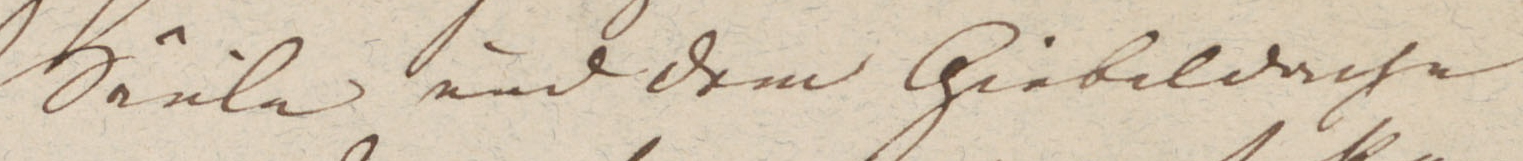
Säule und dem Giebeldache
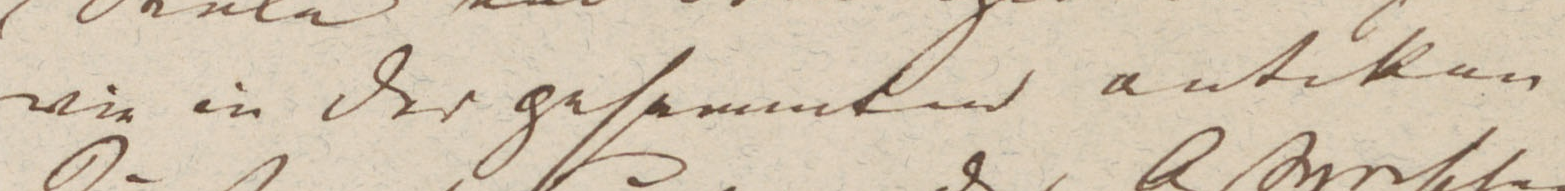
wie in der gesammten antiken
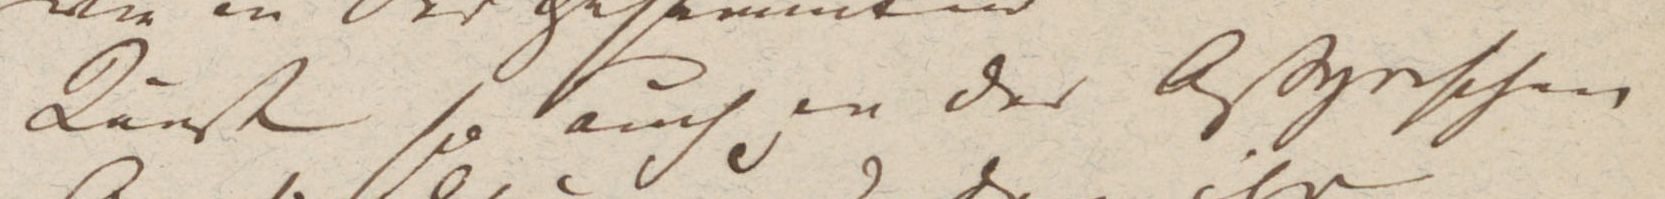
Kunst so auch in der Assyrischen
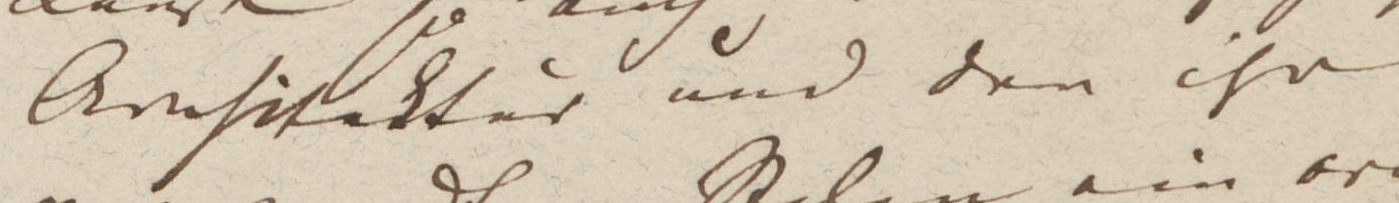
Architektur und den ihr
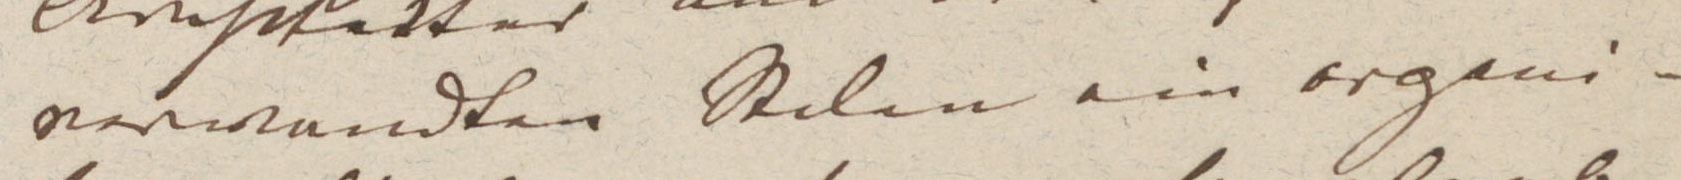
verwandten Stilen ein organi-
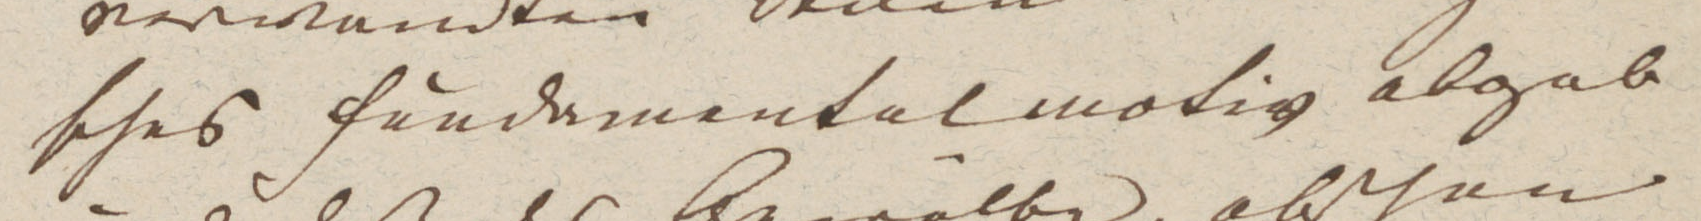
sches Fundamentalmotiv abgab
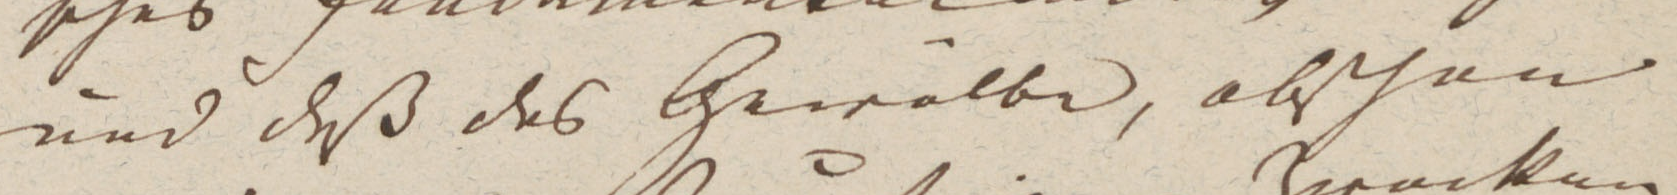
und dass das Gewölbe, obschon
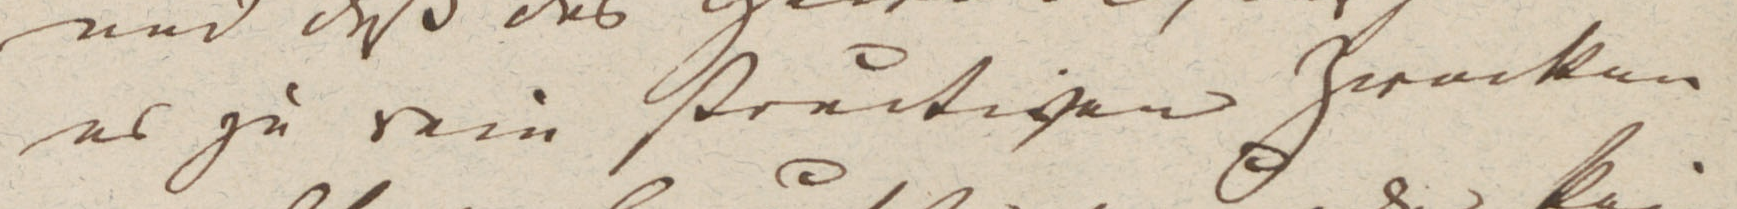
es zu rein structiven Zwecken
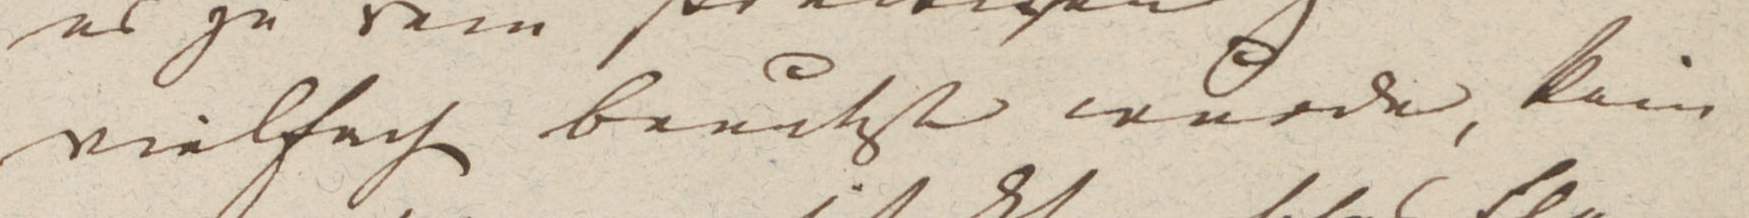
vielfach benutzt wurde, kein
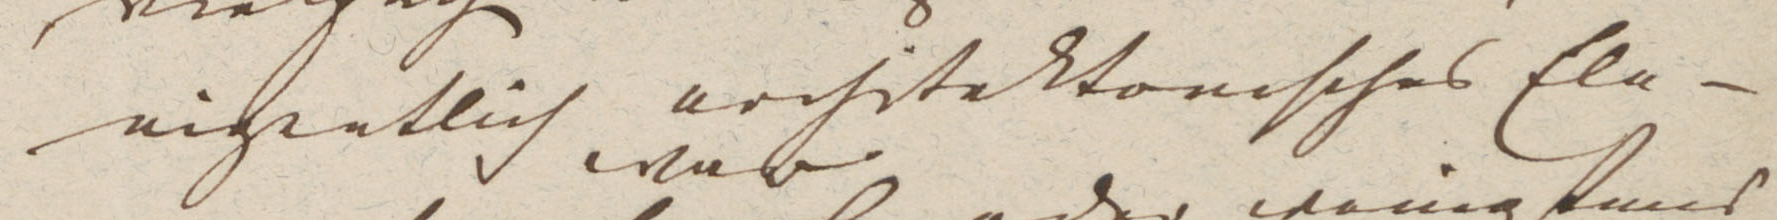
eigentlich architektonisches Ele-
